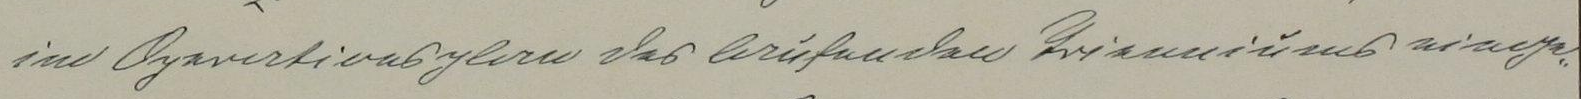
im Operationsplan des laufenden Trienniums einge-
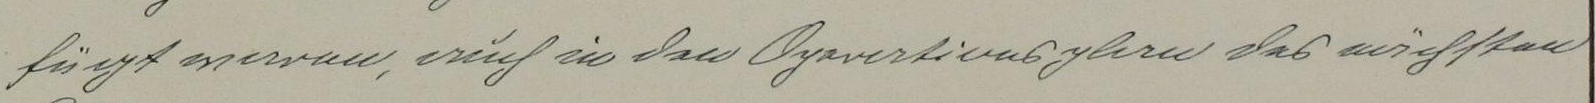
fügt waren, auch in den Operationsplan des nächsten
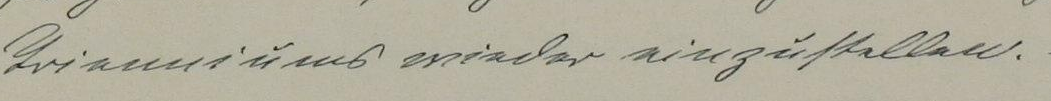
Trienniums wieder einzustellen.
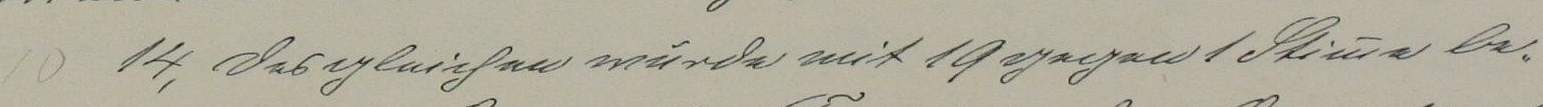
14. Desgleichen wurde mit 19 gegen 1 Stimme be-
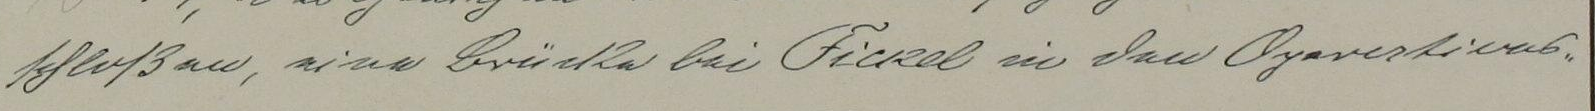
schloßen, eine Brücke bei Fickel in den Operations-
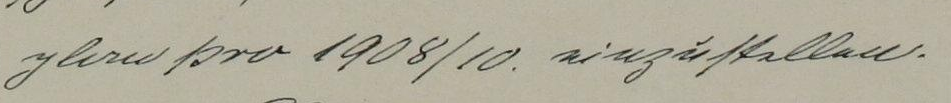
plan pro 1908/10 einzustellen.
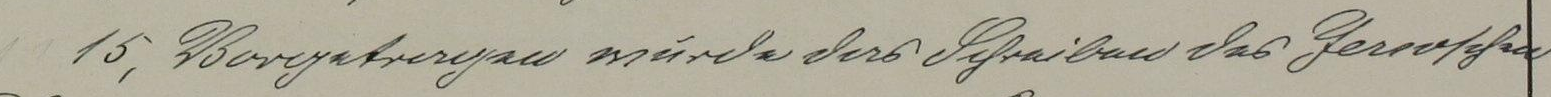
15. Vorgetragen wurde das Schreiben des Jerwschen
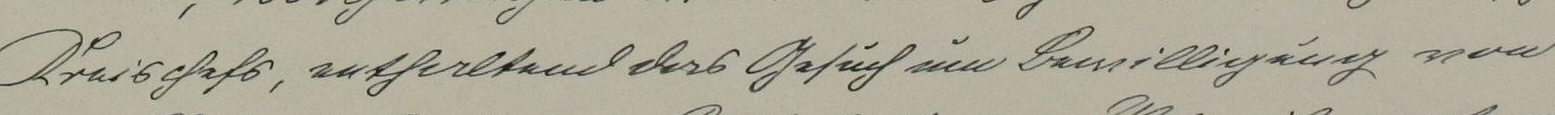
Kreischefs, enthaltend das Gesuch um Bewilligung von
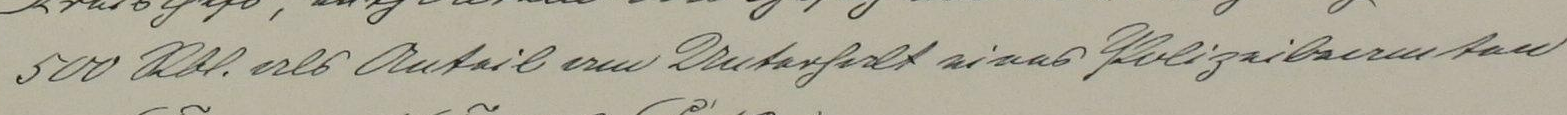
500 Rbl. als Anteil am Unterhalt eines Polizeibeamten
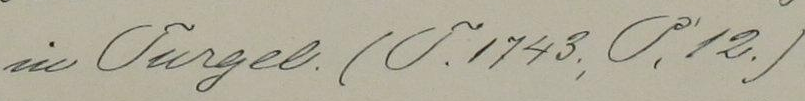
in Turgel (T.1743; P.12).
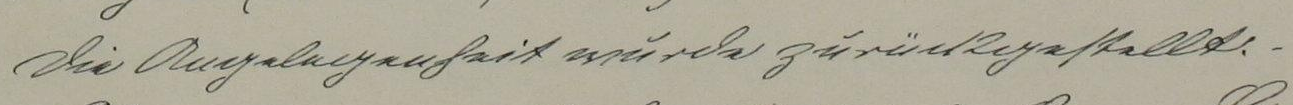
Die Angelegenheit wurde zurückgestellt.
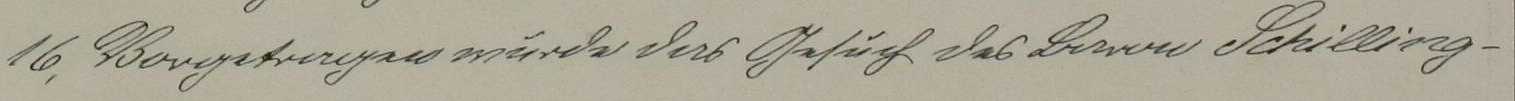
16. Vorgetragen wurde das Gesuch des Baron Schilling-
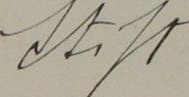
Stift
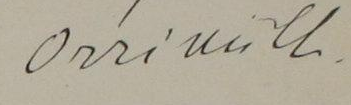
Orriküll
